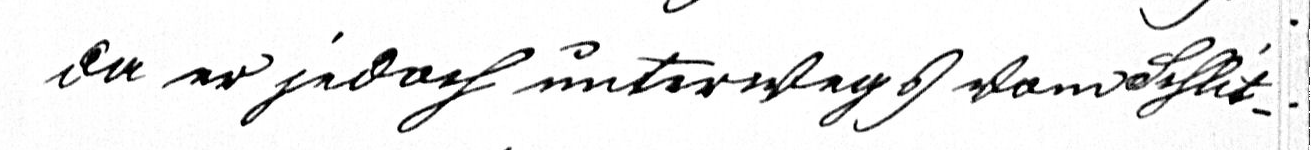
da er jedoch unterwegs vom Schlit¬
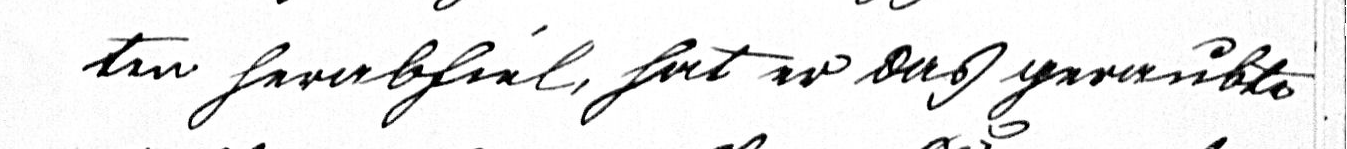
ten herabfiel, hat er das geraubte
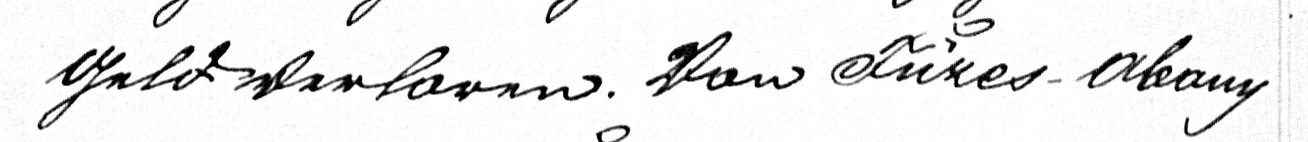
Geld verloren. Von Füzes - Abany
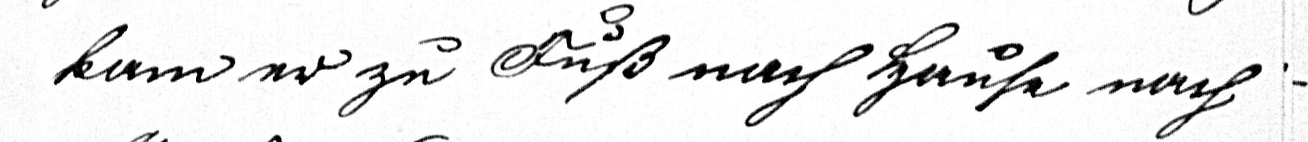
kam er zu Fuß nach Hause nach
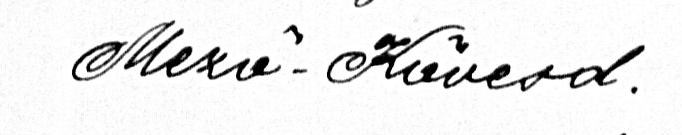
Mezö - Kövesd.
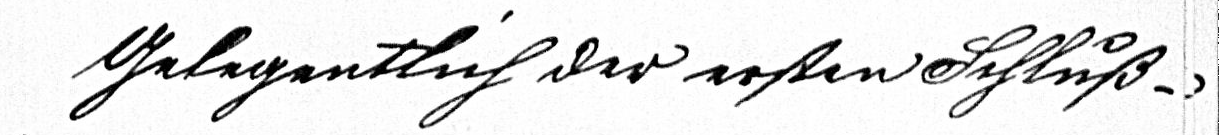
Gelegentlich der ersten Schluß-
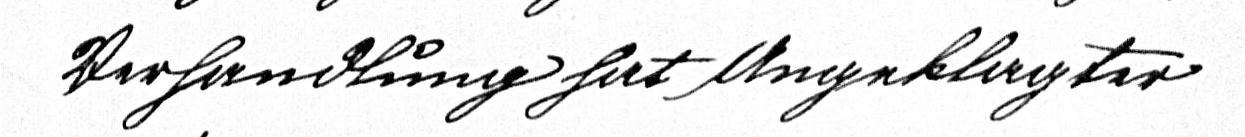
Verhandlung hat Angeklagter
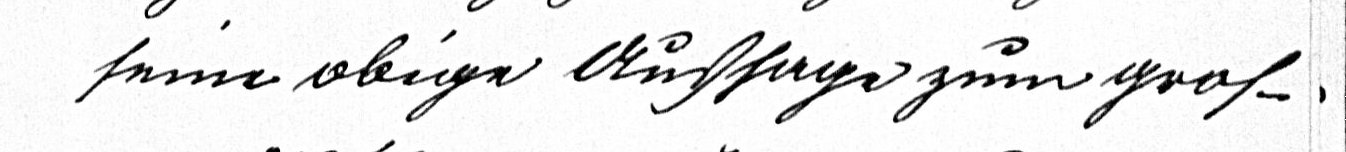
seine obige Aussage zum gros¬
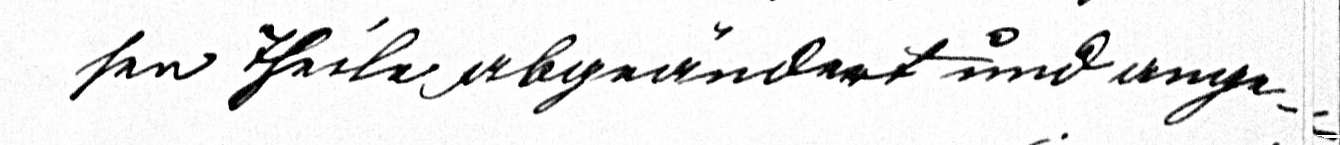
sen Theile abgeändert und ange¬
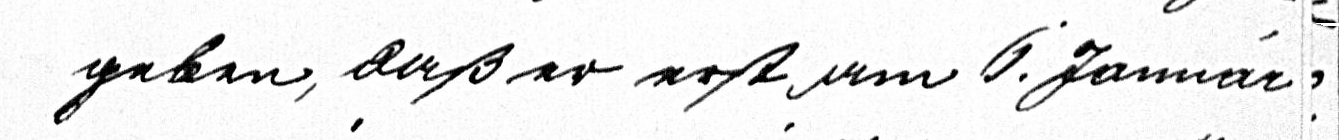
geben, daß er erst am 6. Január
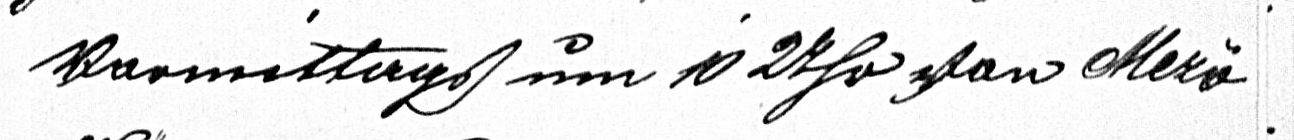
Vormittags um 10 Uhr von Mezö
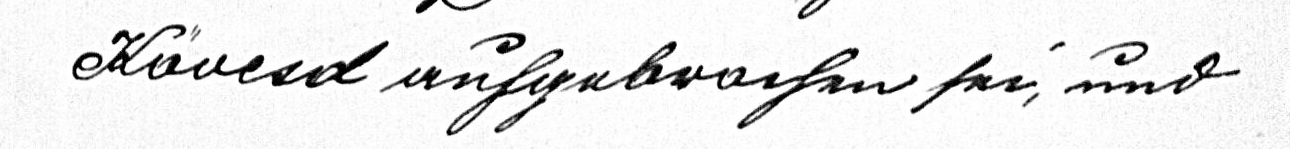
Kövesd aufgebrochen sei, und
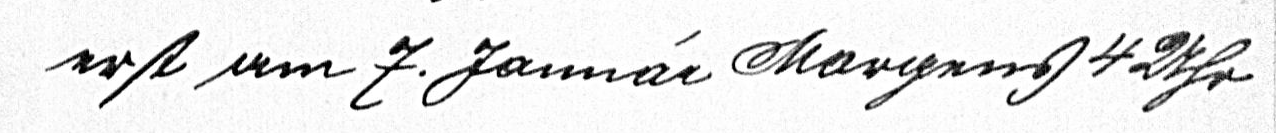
erst am 7. Január Morgens 4 Uhr
